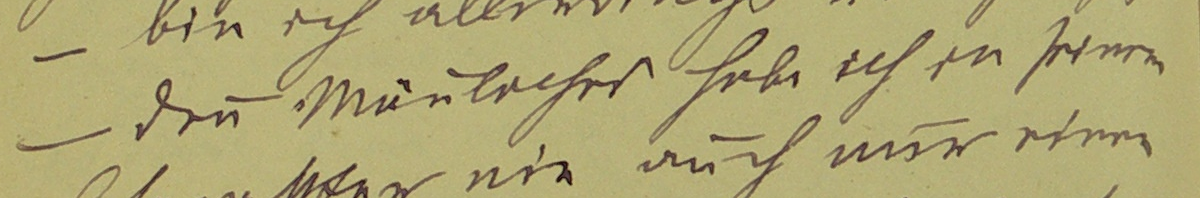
– den Männliches habe ich in seinem
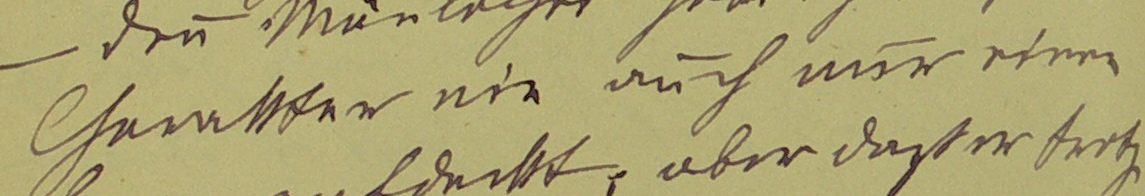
Charakter nie auch nur einen
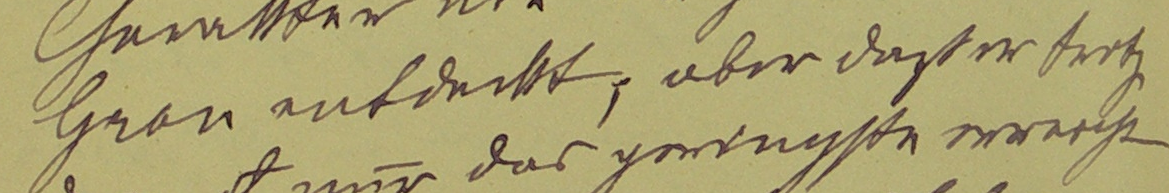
Gran entdeckt, aber daß er trotz¬
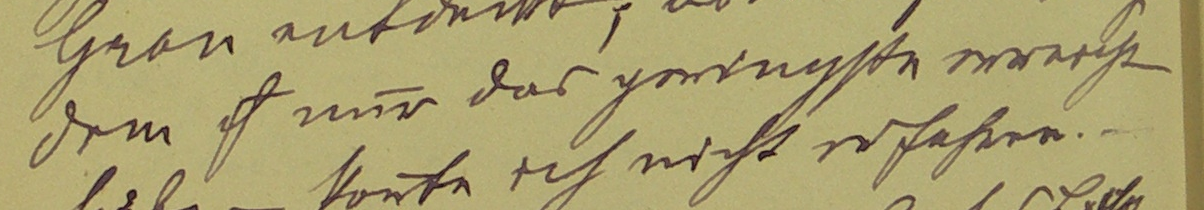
dem auch nur das geringste ???
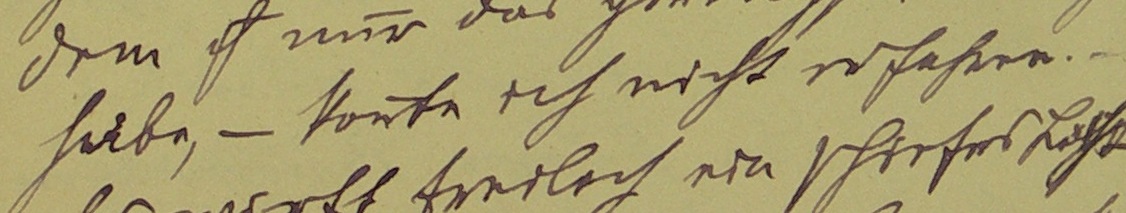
habe, - konnte ich nicht erfahren. —
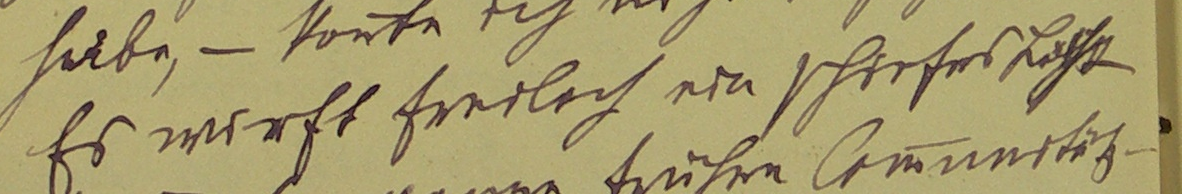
Es wirft freilich ein schiefes Licht
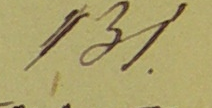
131
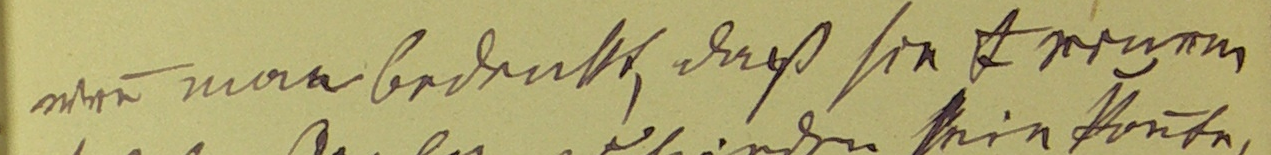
wenn man bedenkt, daß sie t einem solche
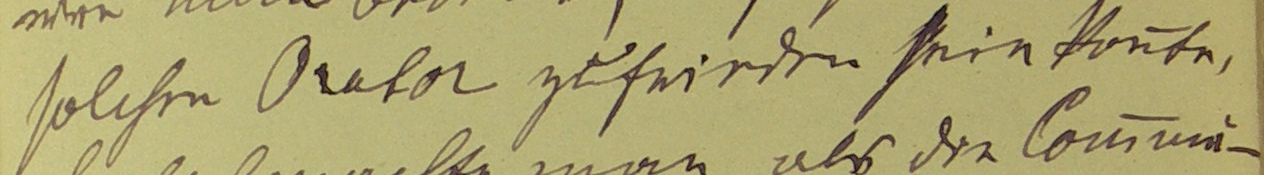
Orator zufrieden sein konte,
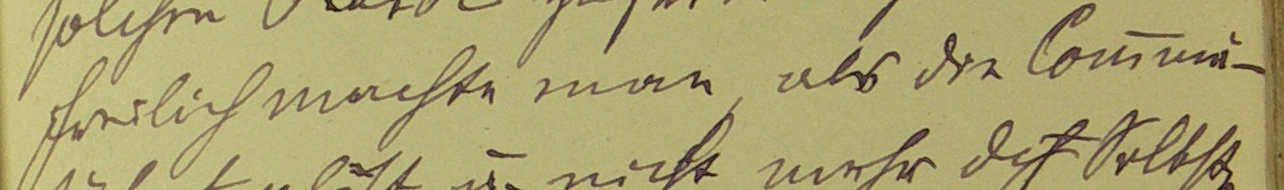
freilich machte man, als die Comuni¬
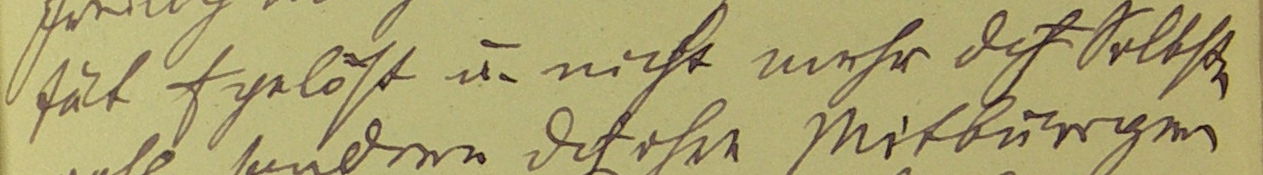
tät fgelöst u. nicht mehr durch Selbst¬
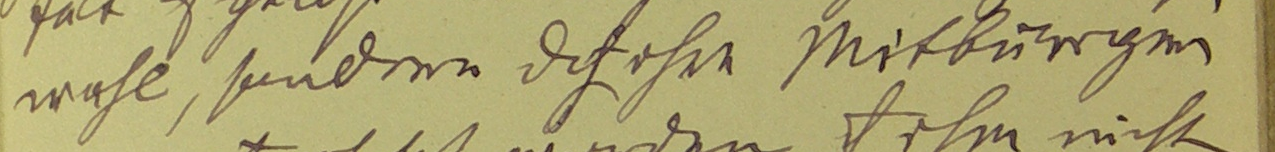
wahl, sondern dch ihre Mitbürger
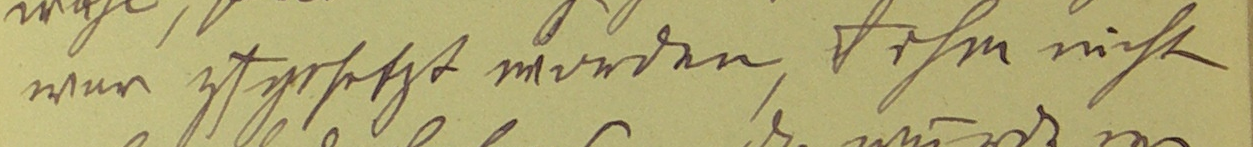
war aufgesetzt worden, t ihm nicht
